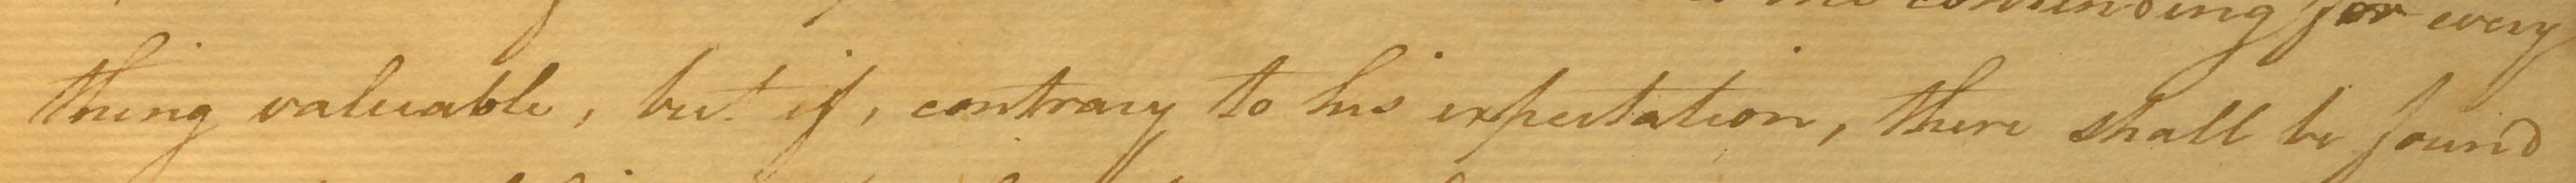thing valuable, but if, contrary to his expectation, there shall be found
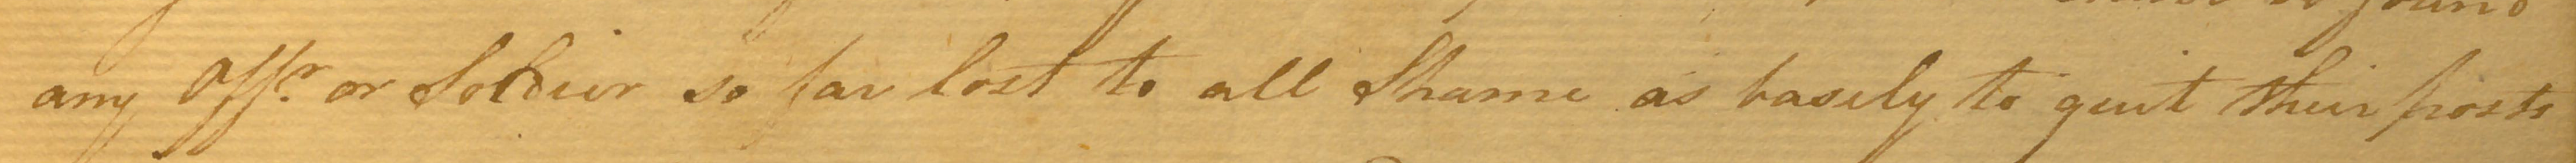any Off^r. or Soldier so far lost to all Shame as basely to quit their posts
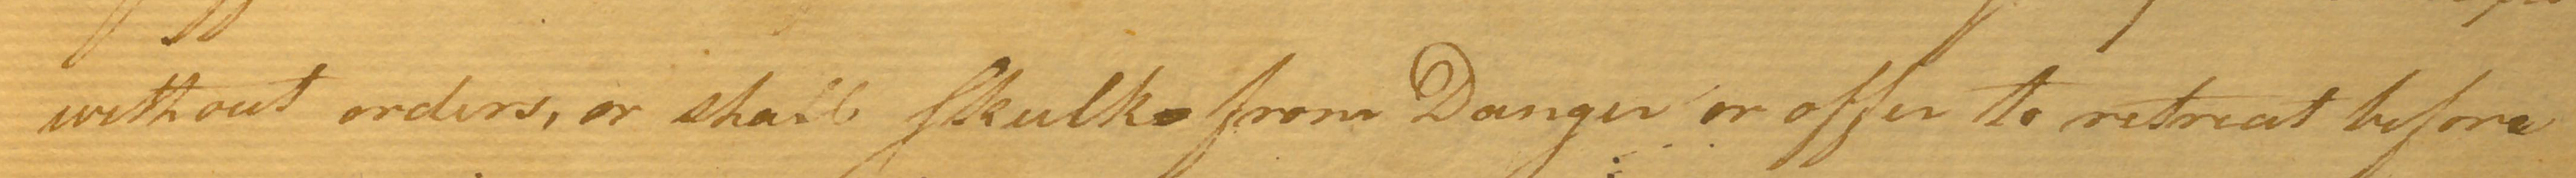without orders, or shall Skulk from Danger or offer to retreat before
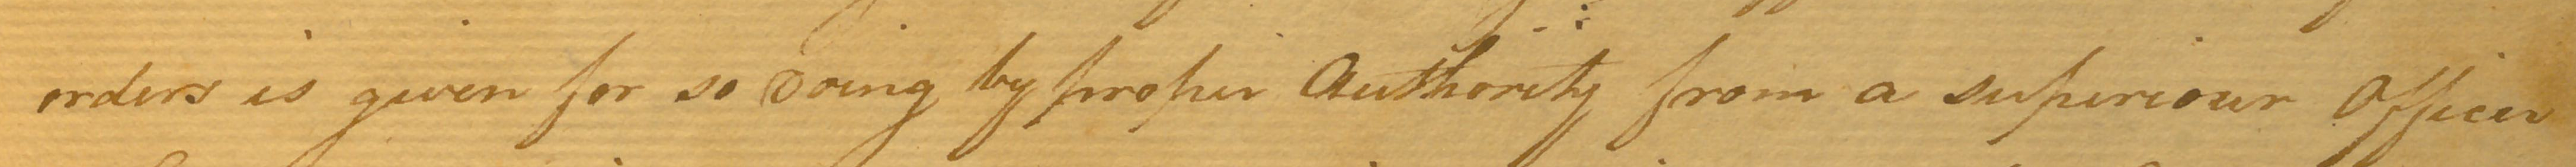orders is given for so doing by proper Authority from a superiour Officer
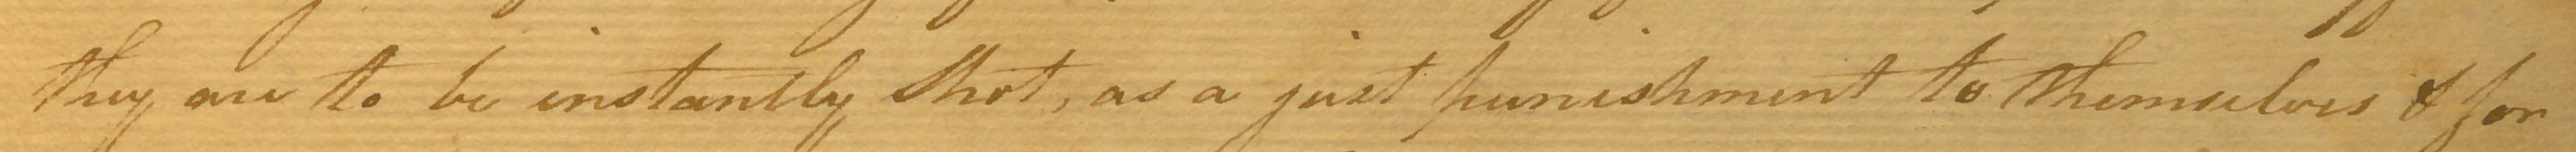they are to be instantly Shot, as a just punishment to themselves & for
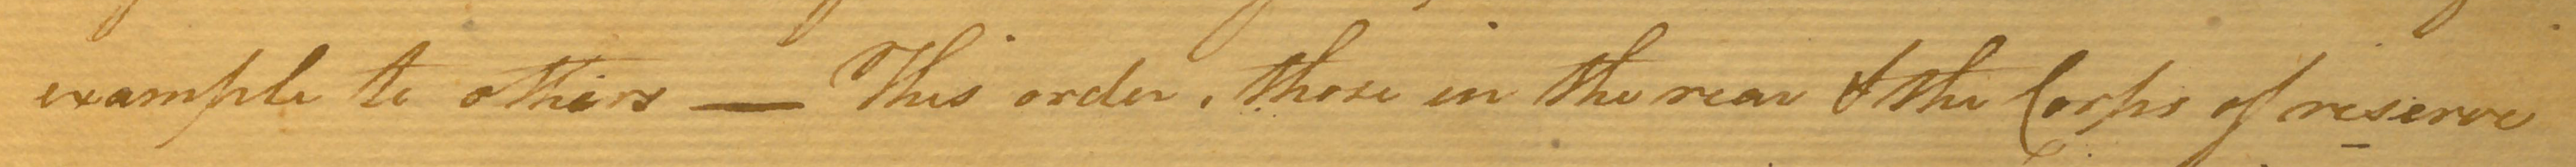example to others- This order, those in the rear & the Corps of reserve
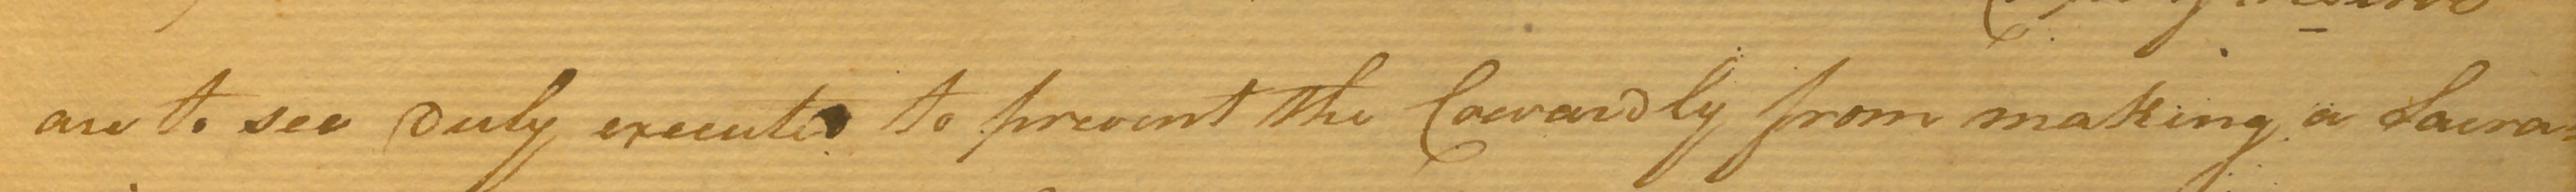are to see duly executed to prevent the Cowardly from making a Sacra-
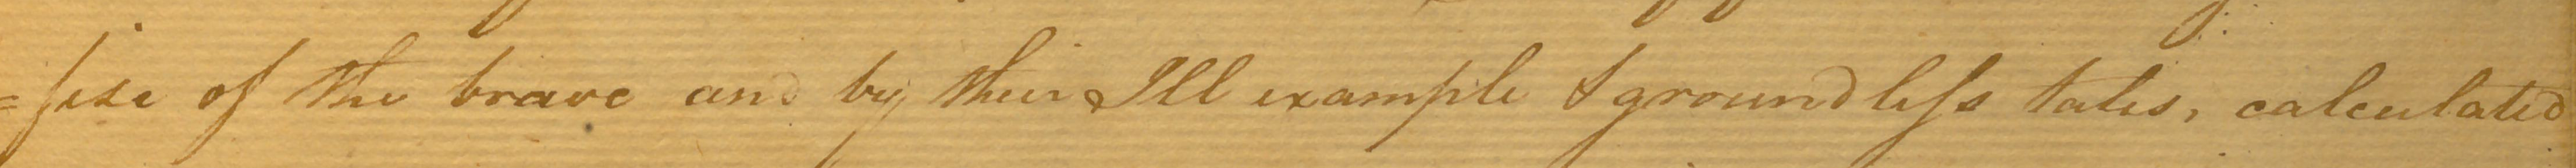-fise of the brave and by their Ill example & groundless tales, calculated
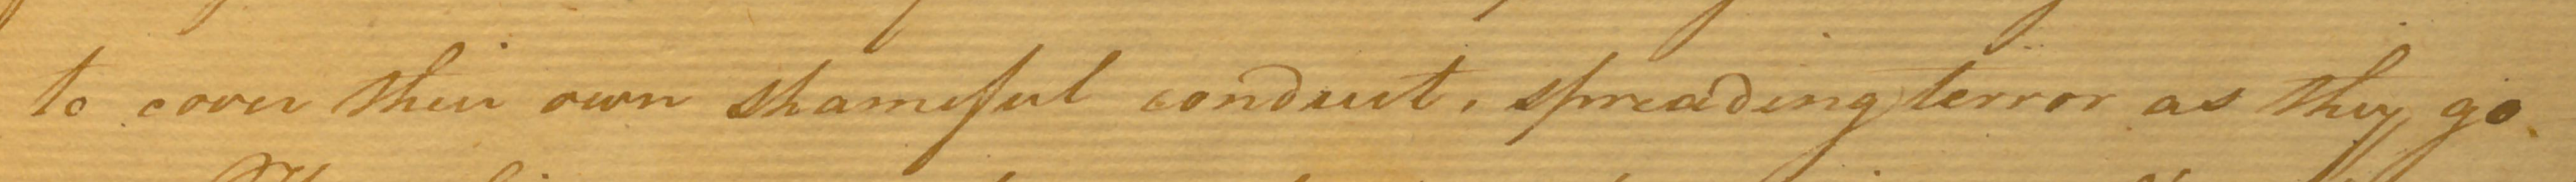to cover their own shameful conduct, spreading terror as they go.
